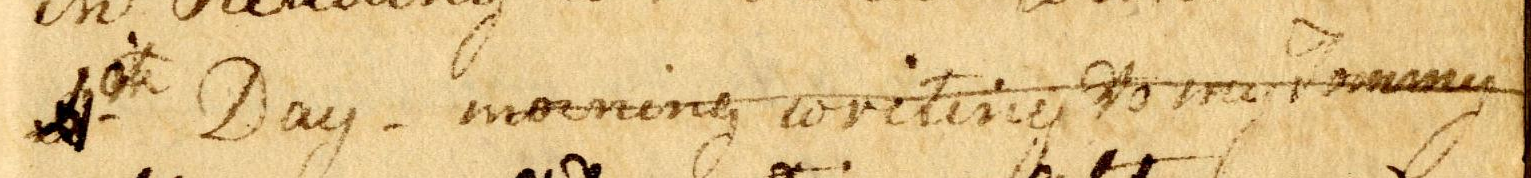4^th Day- morning writing to my Tommy
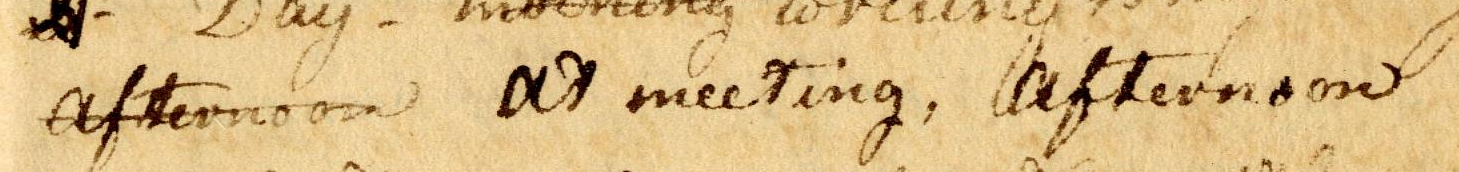Afternoon, At meeting, Afternoon
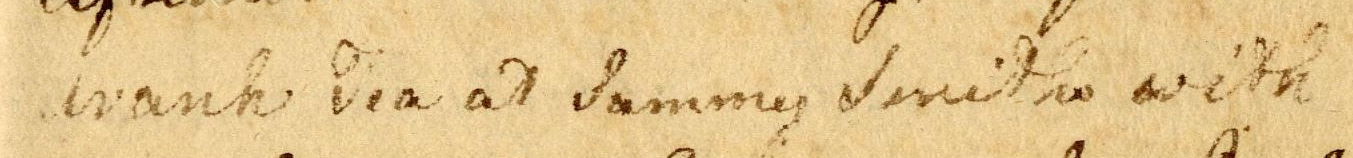drank Tea at Sammy Smiths with
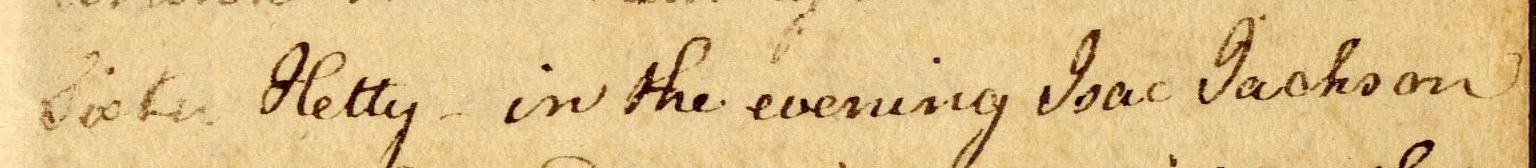Sister Hetty- in the evening Isac Jackson
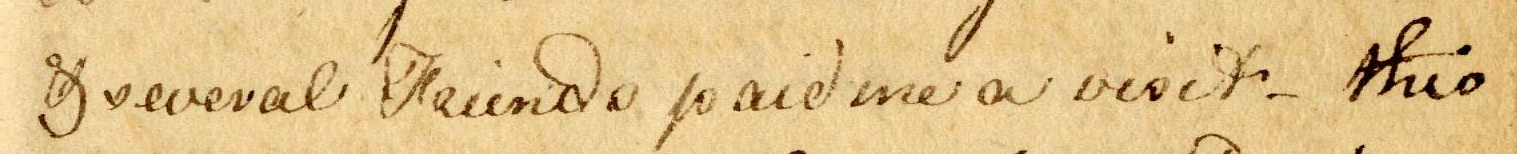& several Friends paid me a visit- this
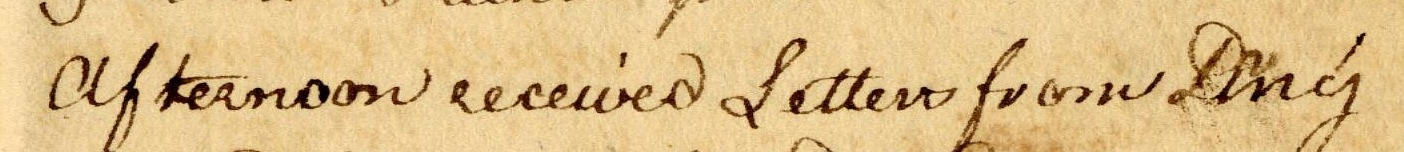Afternoon received Letters from [Dny]
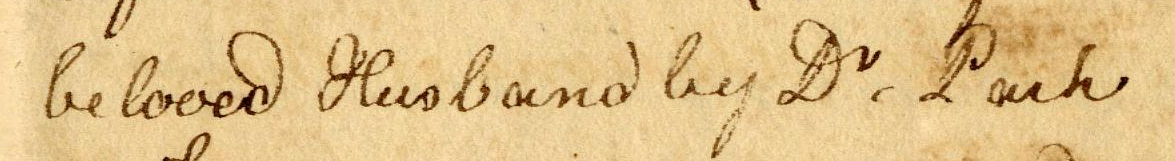beloved Husband by D^r- Park
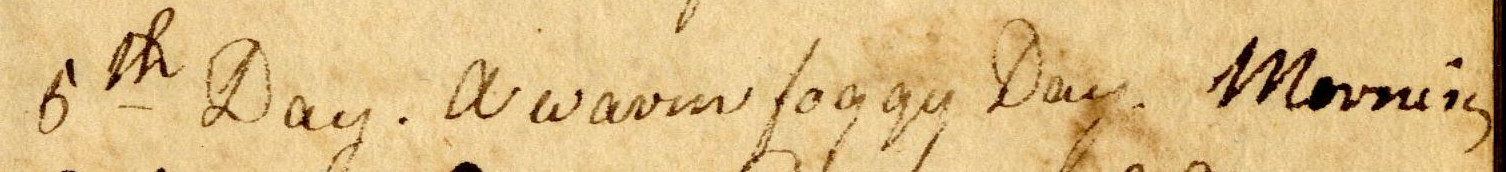5^th Day. A warm foggy Day- Morning
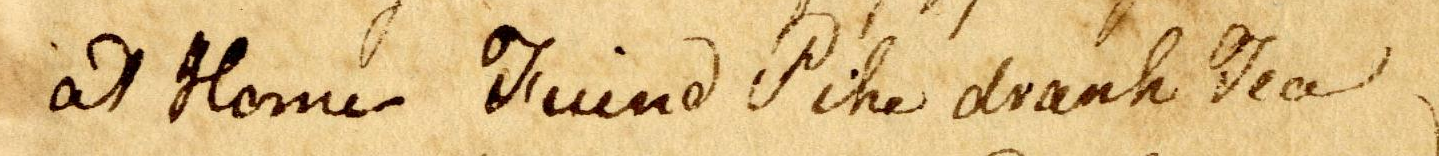at Homes Friend Pike drank Tea
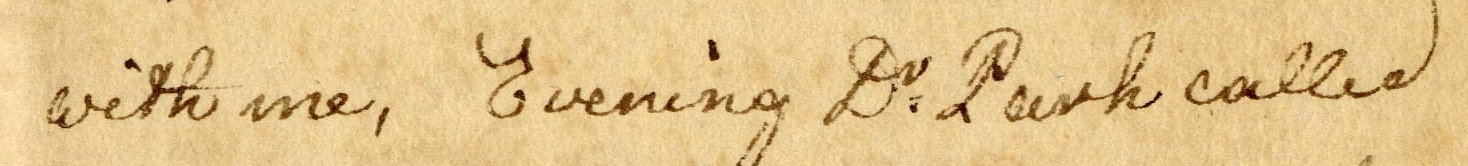with me, Evening D^r. Park called
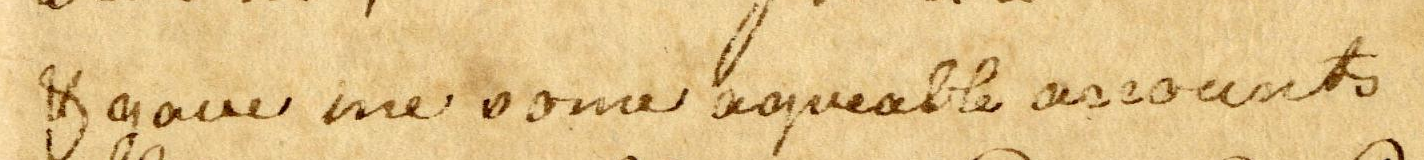& gave me some agreable accounts
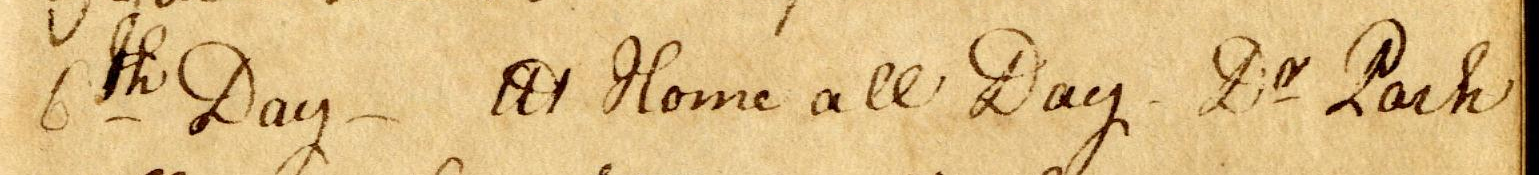6^th Day- At Home all Day- D^r Park
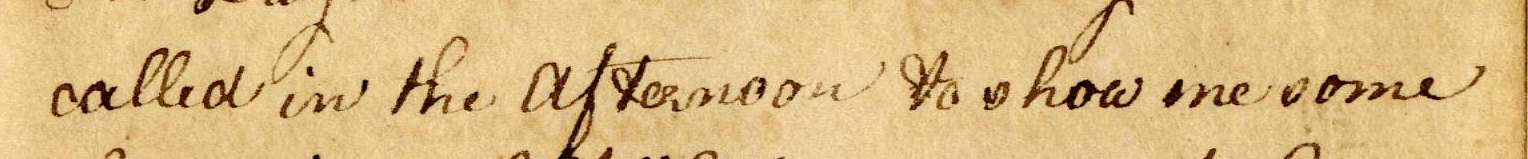called in the Afternoon to show me some
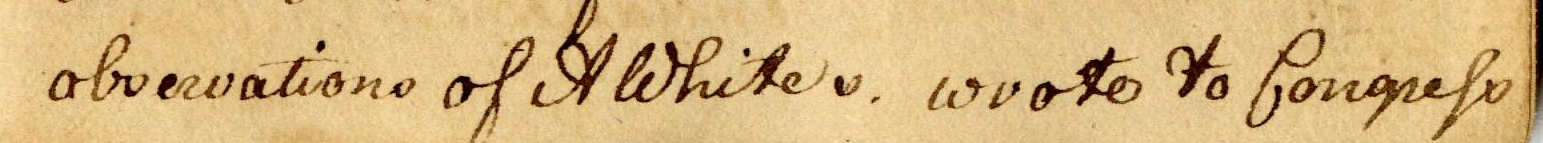observations of A Whites. wrote to Congress
